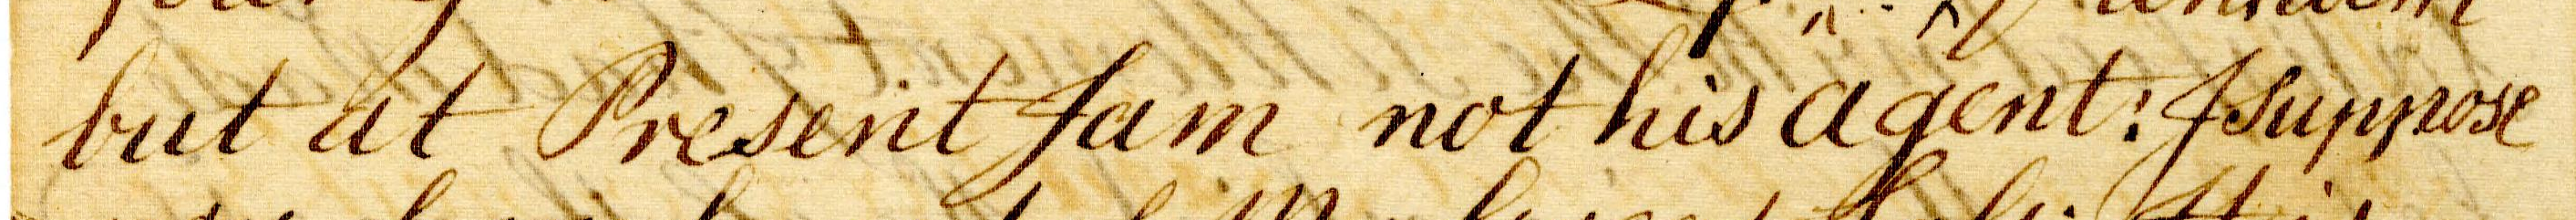but at Present I am not his agent: I suppose
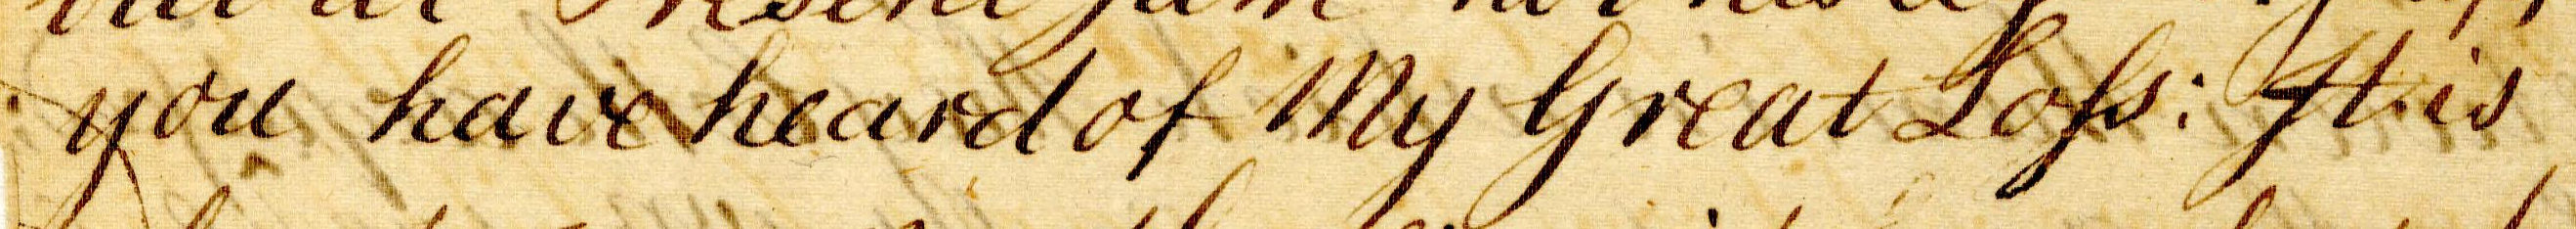you have heard of My Great Loss: It is
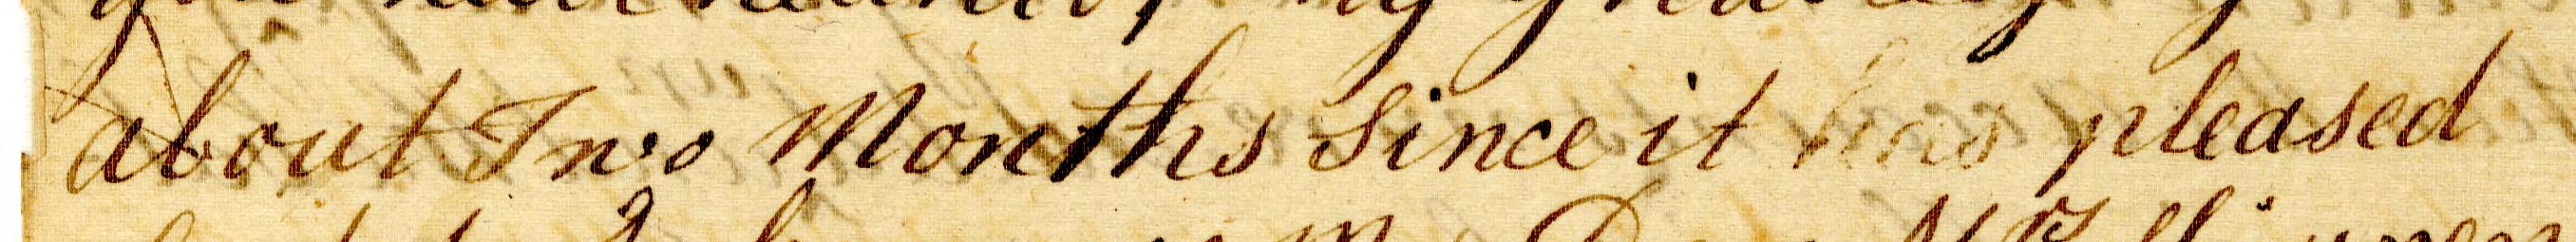About Two Months Since it [has] pleased
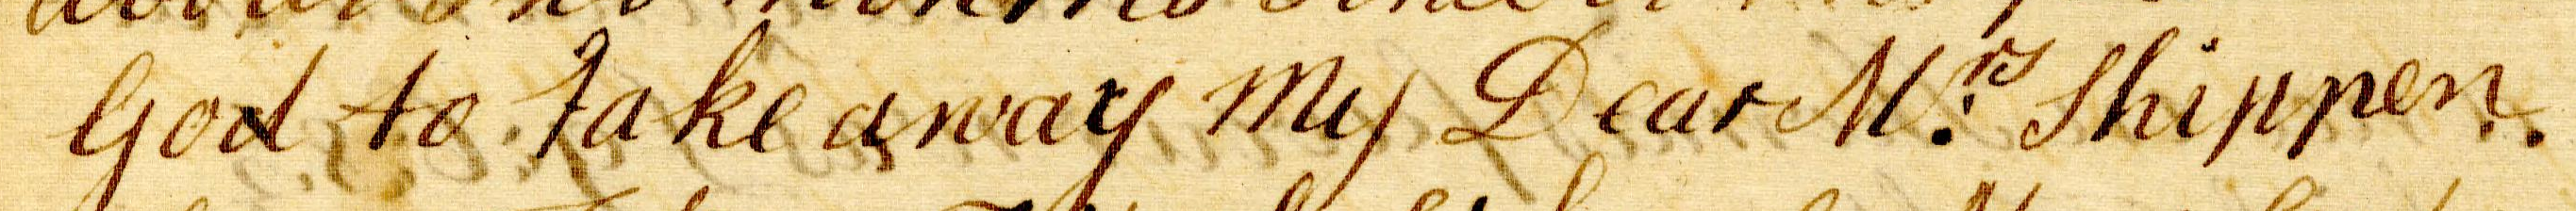God to take away My Dear M^rs. Shippen
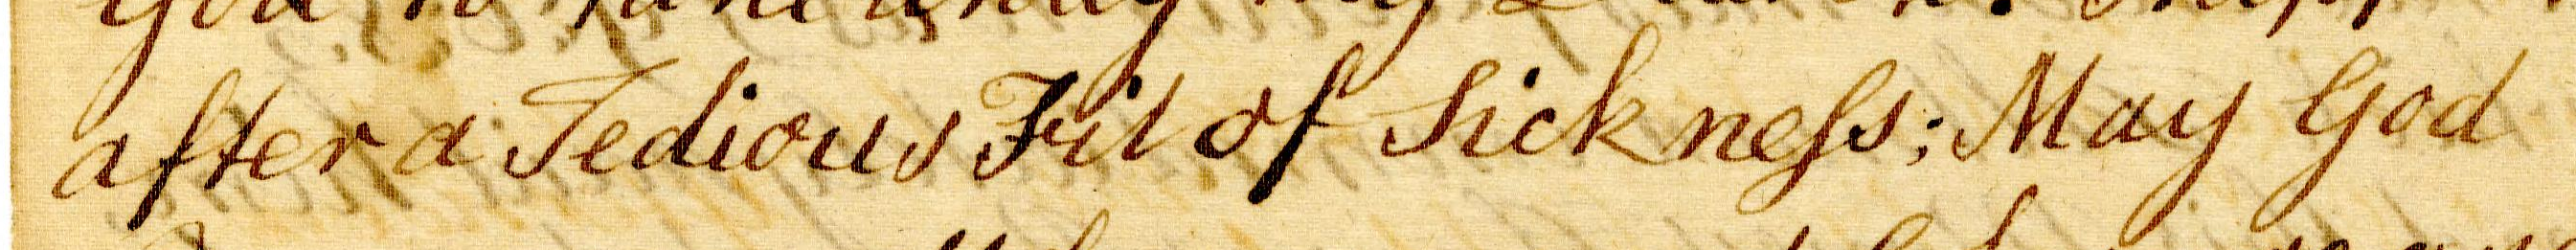after a Tedious Fit of sickness; May God
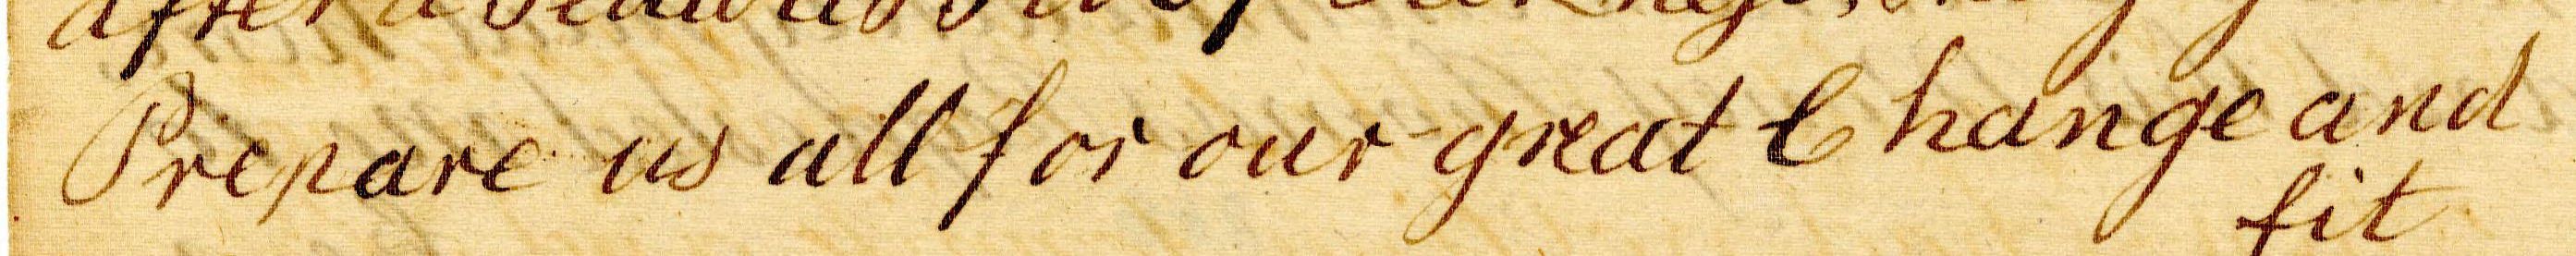Prepare us all for our great Change and
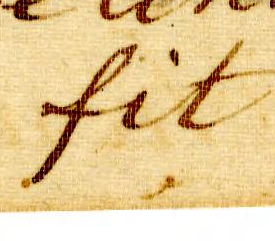fit
